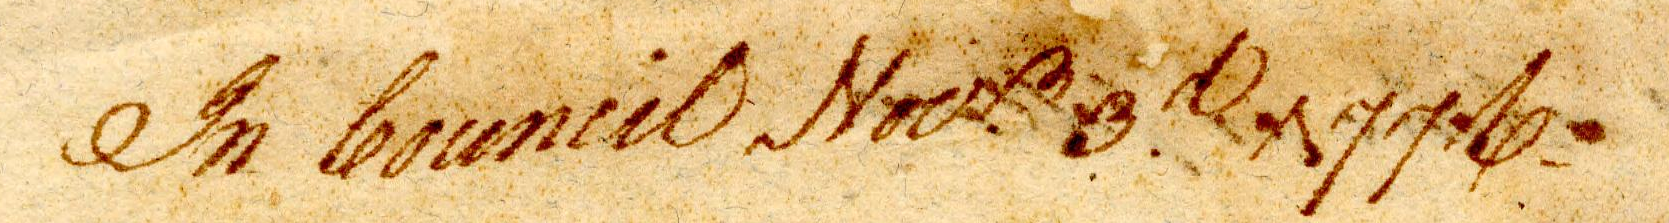In Council Nov^r. 3.^d, 1776.
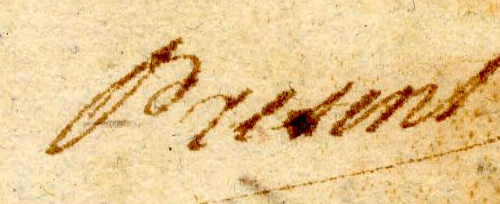Present
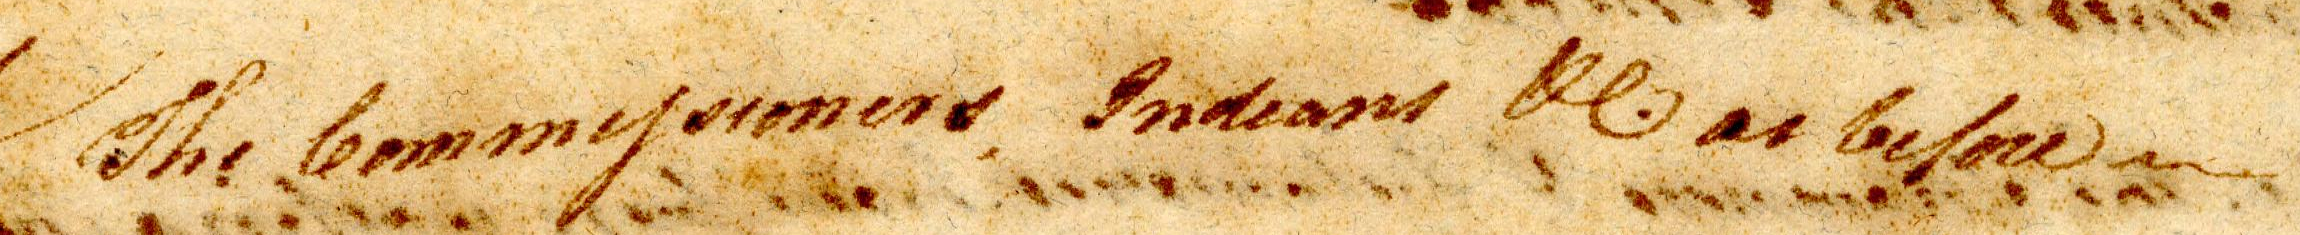The Commissoners, Indeans &c as before-
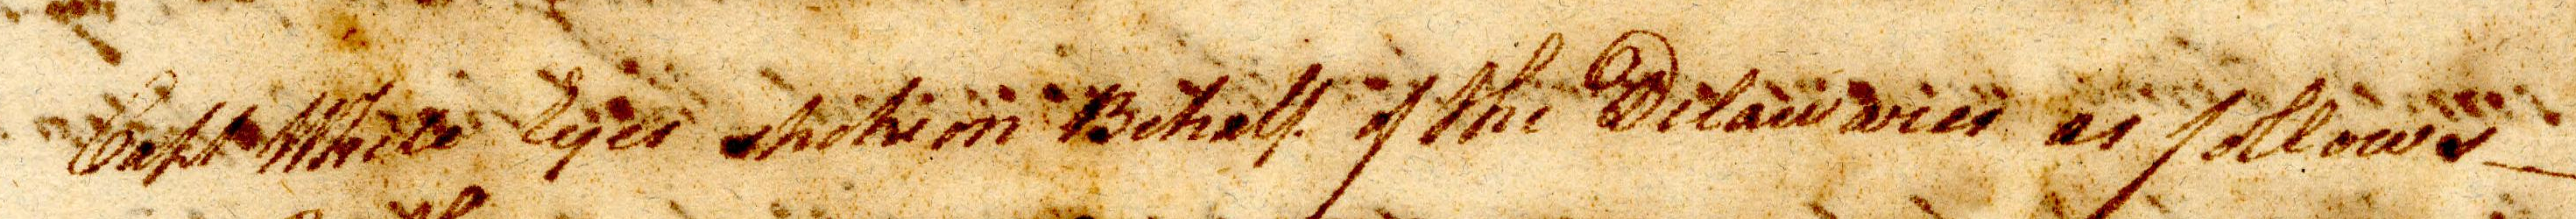Capt White Eyes spoke on Behalf of the Delawares as follows-
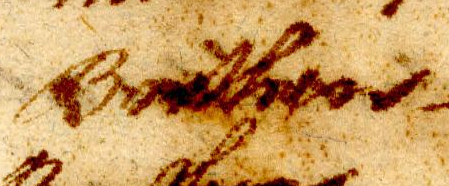Brothers-
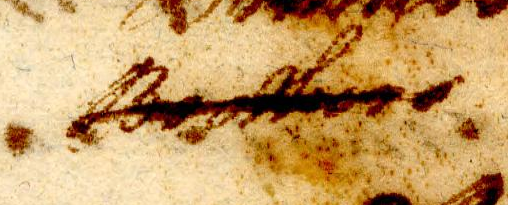Brothers
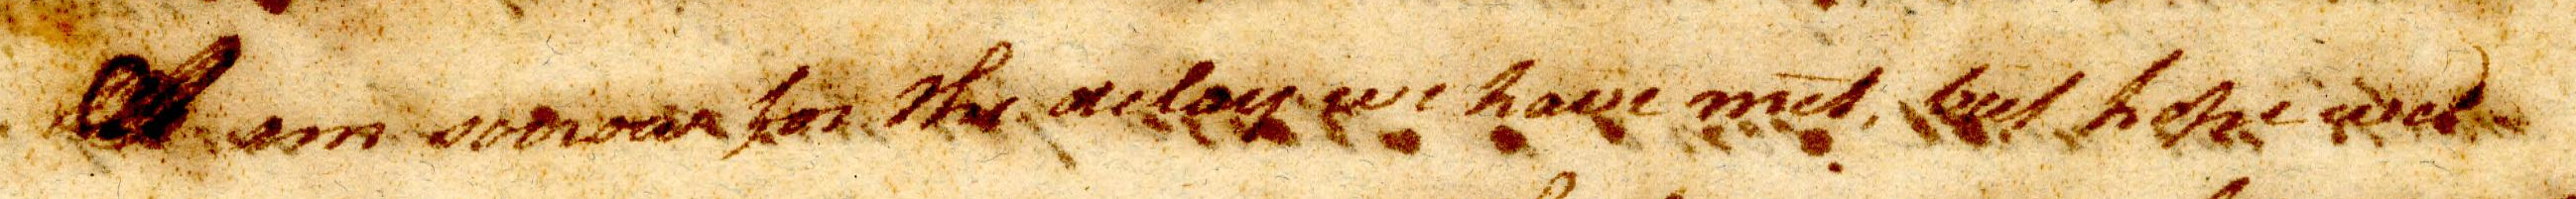I am sorry for the delay we have met, but hope we
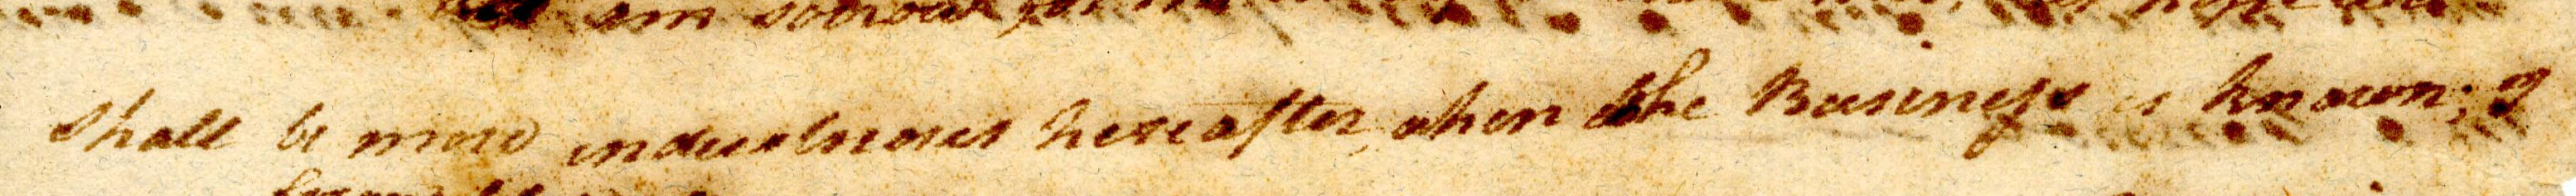shall be more industrious hereafter when the Business is known; I
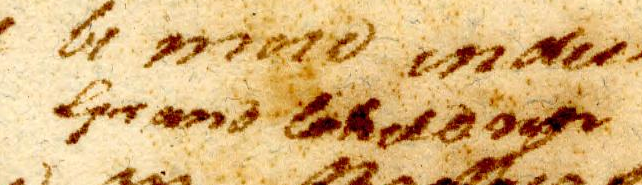Grand Children
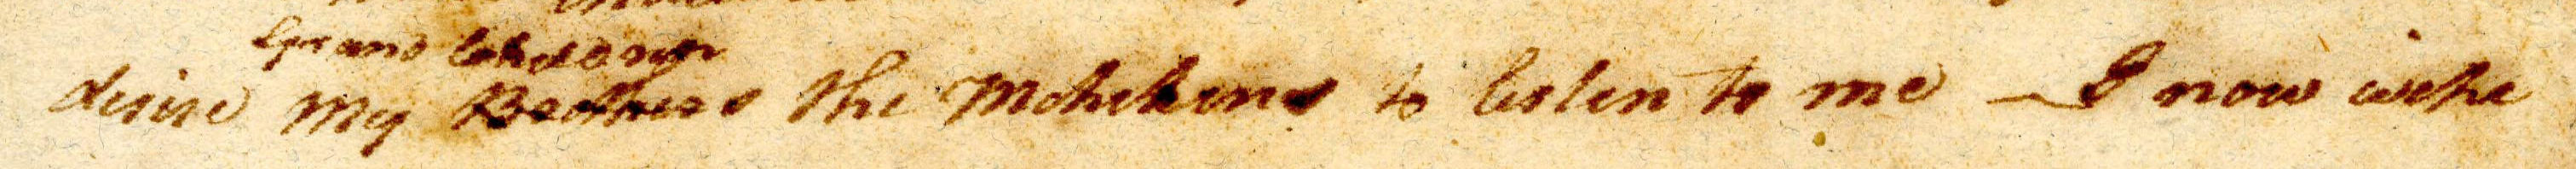desire my ^ Brothers the mohekins to listen to me. I now wipe
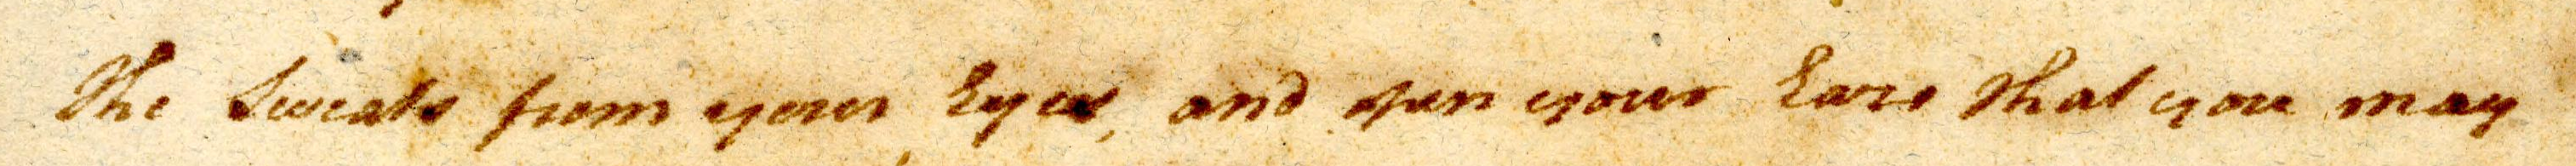The Sweats from your Eyes, and open your Ears that you may
